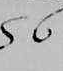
56
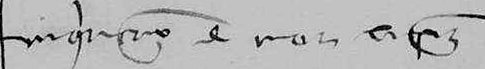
Jmqirição de mor lopez
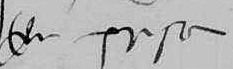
Ree presa
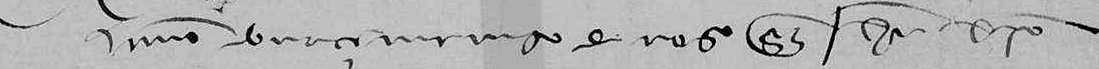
Anno do naçimemto de noso s̄or Jh̄u xp̄o
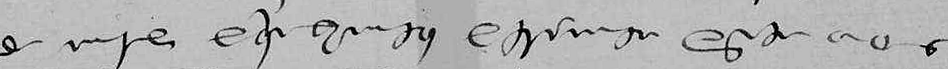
de mjl e qinhentꝯ e trimta e sete aos
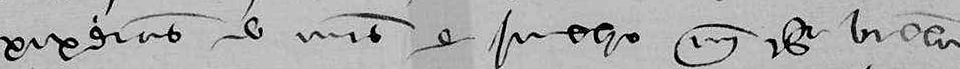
xix dias do mes de Julho em esta villa
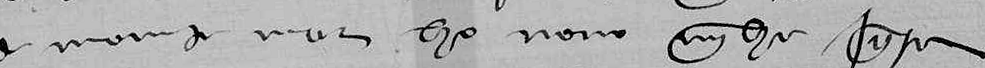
de momtemor ho nouo em ha Jḡja
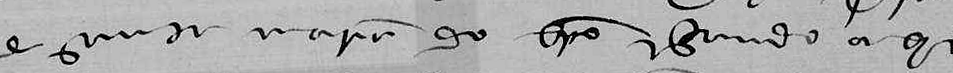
de santa maria do bp̄o estando ahi
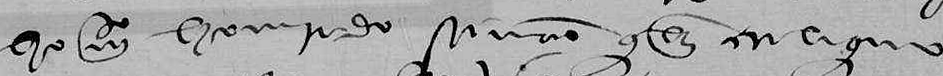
ho mto homrado simão gl̄z creliguo
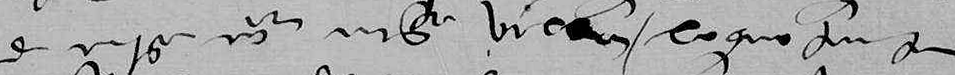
de mjsa mor nesta villa / loguo tente
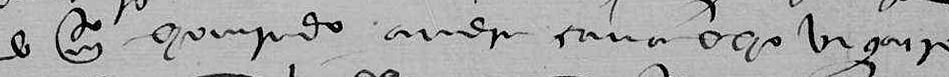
do mto homrado andre carualho vigairo
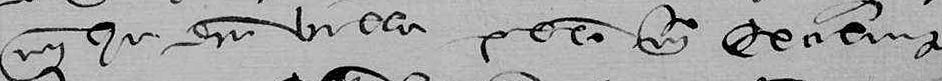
em ha dīa villa pll̄o mto Excelente
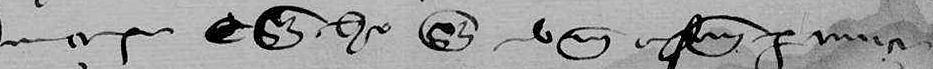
pincepe E s̄or ho s̄or dom afom̄ ꝑ merce
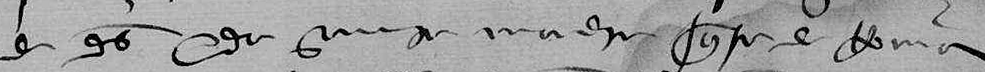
de ds̄ e da santa madre Jḡja de Roma
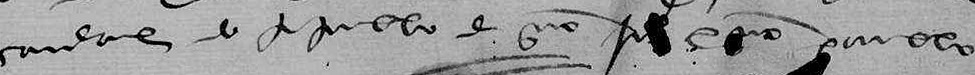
cardeal do titullo de são Jmo e são paullo
